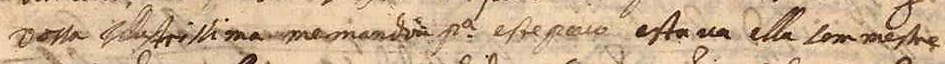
Vossa Illustrissima me mandou p.a este pouo estaua ella sem mestre
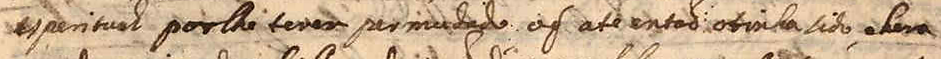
esperitual por lhe terem permudado, o q̄ ate entaõ o tinha sido, e hera
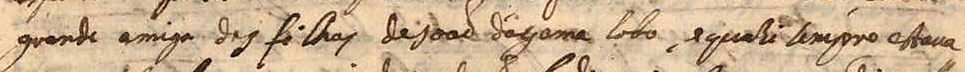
grande amiga das filhas de joaõ da gama lobo, e quazi sempre estaua
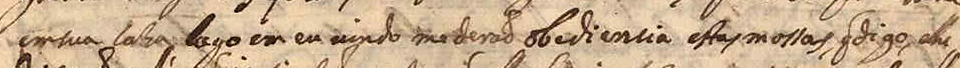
em sua caza, logo em eu uindo me deraõ obediencia estas mossas, q̄ digo, e lhe
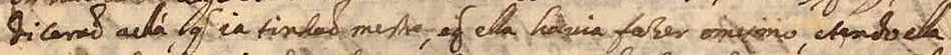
diceraõ a ella, q̄ ia tinhaõ mestre, e q̄ ella hauia fazer o mesmo, e tendo ella
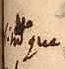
imto que
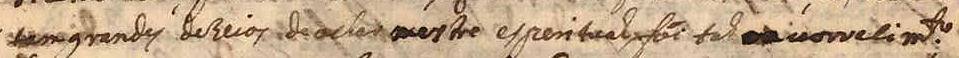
tam grandes dezeios de achar mestre esperitual, foi tal o auorrecim.to
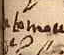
a tomou
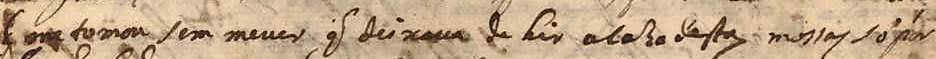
q̄ me tomou sem me uer, q̄ deixaua de hir a caza destas mossas só por
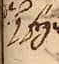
q̄ fogi
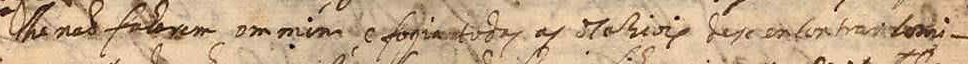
lhe naõ falarem em mim, e fogia todas as ocaziois de se encontrar comi
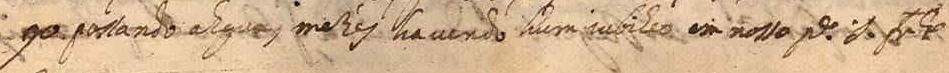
go passando alguns mezes hauendo hum iubileo em nosso p.e S. frco
